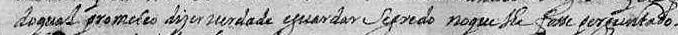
do qual prometeo dizer uerdade e guardar Segredo no que lhe fosse perguntado
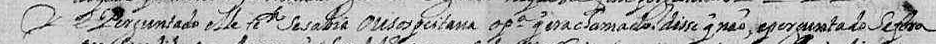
item E Perguntado elle teta se sabia ou sospeitaua o p.a q̄ era chamado? disse q̄ naõ, e perguntado se fora
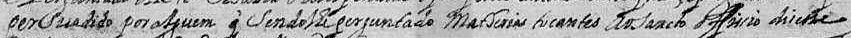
persuadido por alguem q̄ Sendolhe perguntado Matherias tocantes ao Sancto offissio disesse
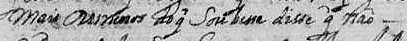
mais ou menos do q̄ Soubesse disse q̄ não
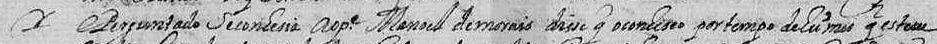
item E Perguntado Se conhesia ao p.e Manoel de morais disse q̄ o conheseo por tempo de hū mes q̄ esteue
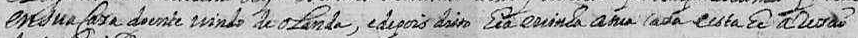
en sua Caza doente uindo de olanda, e depois disto hia e uinha a sua casa e esta he a Rezaõ
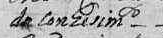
do conhecimto
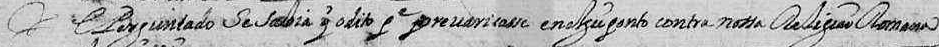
item E Perguntado Se sabia q̄ o dito pe preuaricasse en algū ponto contra nossa Religião Romana
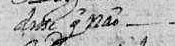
disse q̄ não
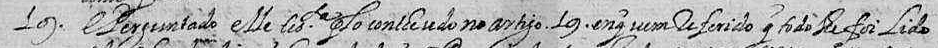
19. E Perguntado elle tes.ta plo contheudo no artigo. 19. en q̄ uem Referido q̄ todo lhe foi Lido
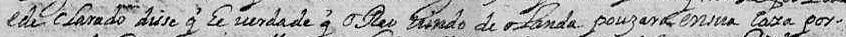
e declarado disse q̄ he uerdade q̄ o Reo uindo de olanda pouzara en sua caza por
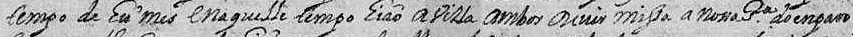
tempo de hū mes e naquelle tempo hiaõ a Villa ambos ouuir missa a nossa s.ra do enparo
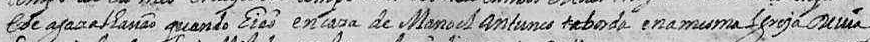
e se agazalhauão quando hiaõ en caza de Manoel antunes taborda e na mesma Igreja ouuia
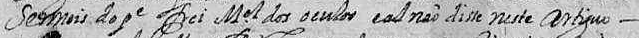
Sermois do pe frei M.el dos oculos e al naõ disse neste artiguo
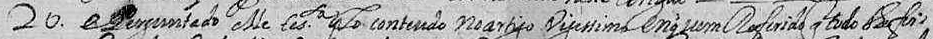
20. e Perguntado elle testa plo conteudo no artigo Vigessimo en q̄ uem Referido q̄ todo lhe foi
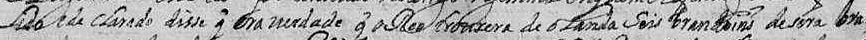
lido e declarado disse q̄ era uerdade q̄ o Reo trouxera de olanda seis brandoins de sera bra
